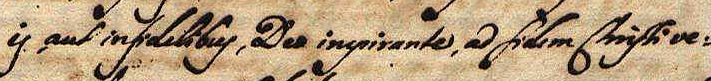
is aut infidelibus, Deo inspirante, ad fidem Christi ve
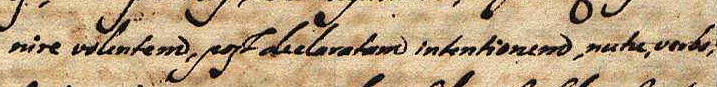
nire volentem, post declaratam intentionem, nutu, verbo,
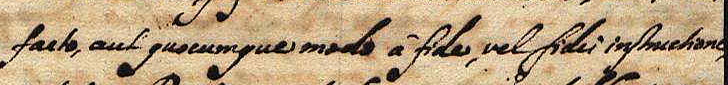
facto, aut quocumque modo á fide, vel fidei instructione,
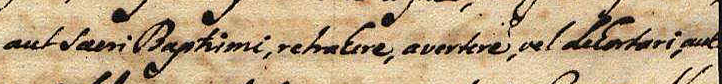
aut sacri Baptismi, retrahere, avertere, vel dehortari, aut
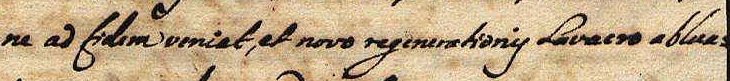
ne ad fidem veniat, et novo regenerationis Lavacro ablua
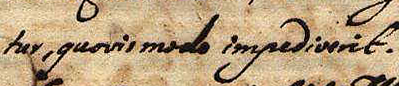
tur, quovis modo impediverit.
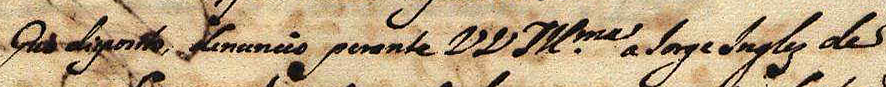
Que dispostto, denuncio perante VV. Ill.ma a Iorge Inglez de
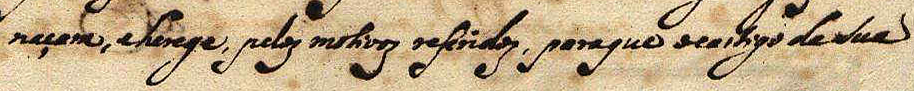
naçam, e herege, peloz motivoz referidoz, para que o castigo da Sua
